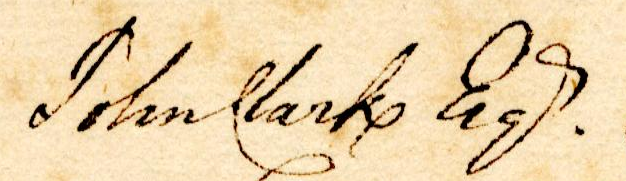John Clark Esq^r
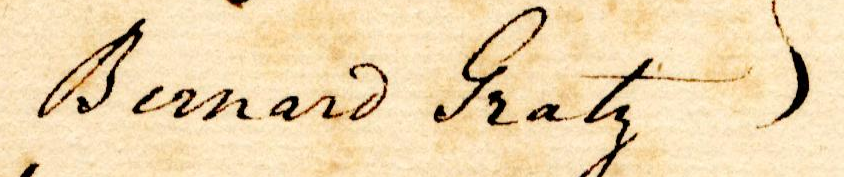Barnard Gratz
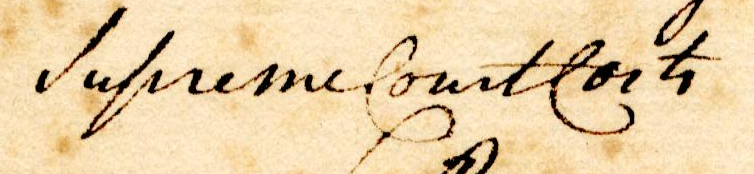Supreme Court co^ty
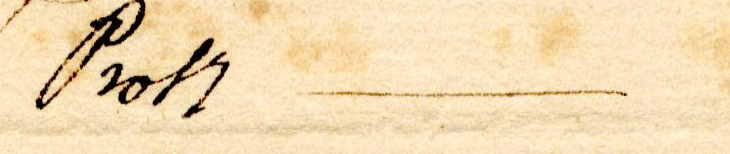Pross
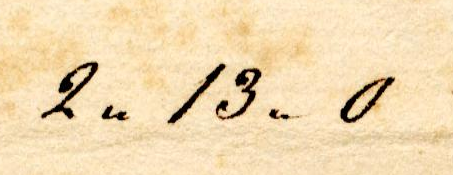2..13..0
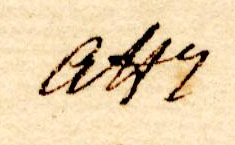Att^y
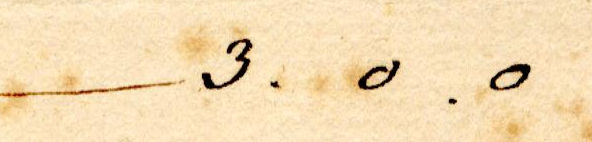3.0.0
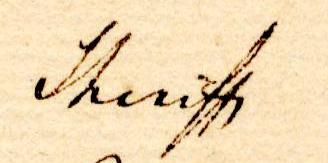Sheriffs
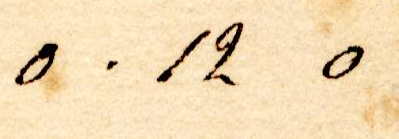0.12.0
